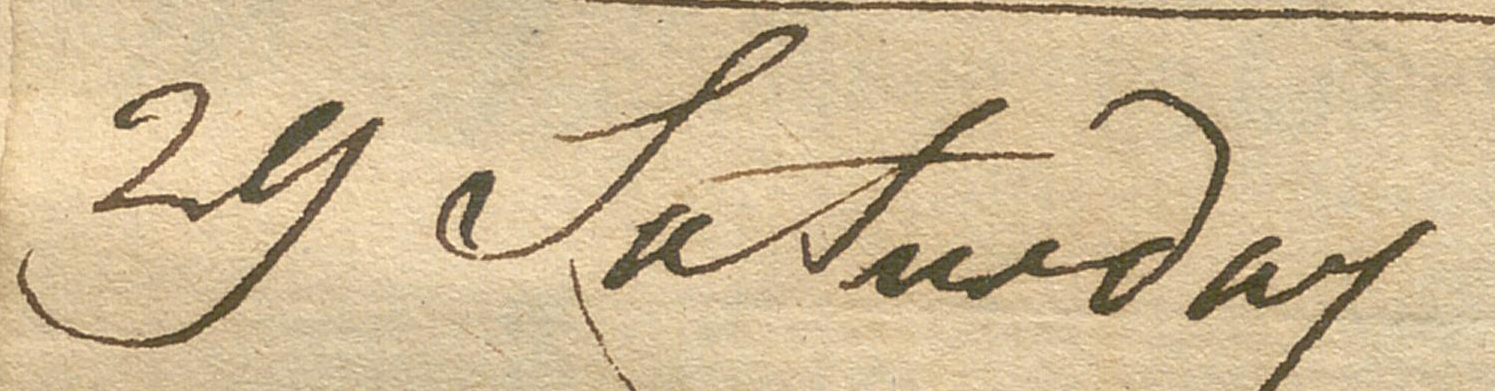29 Saturday
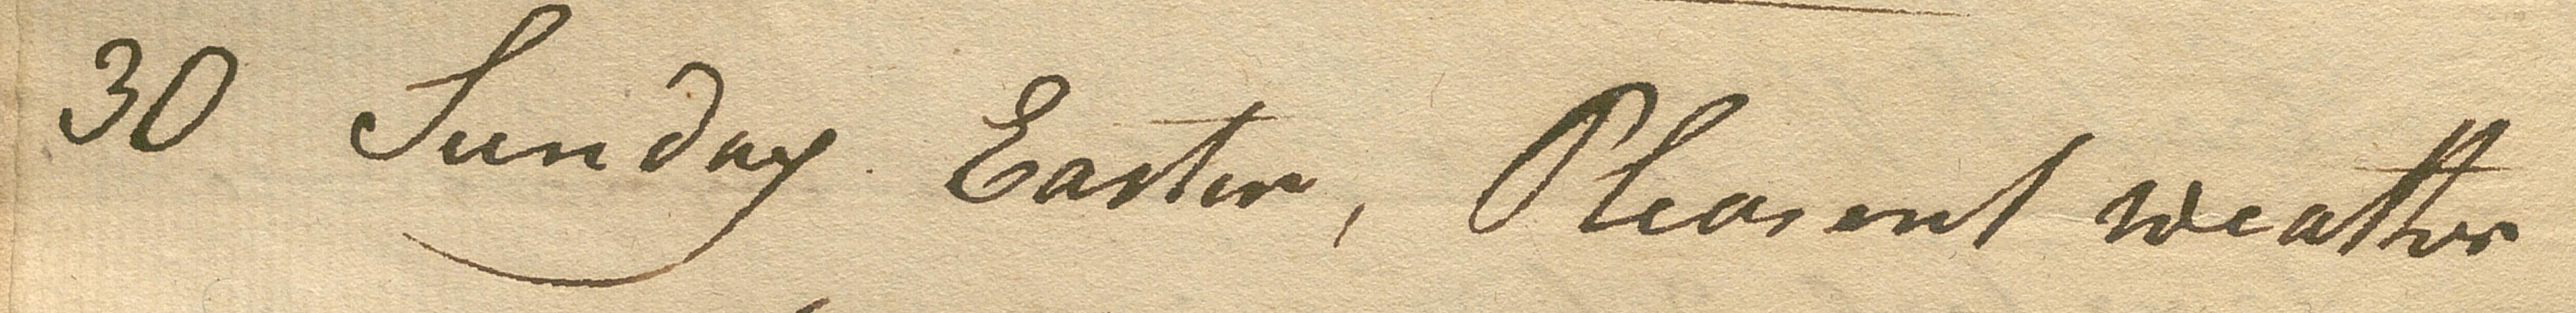30 Sunday Easter, Pleasent weather
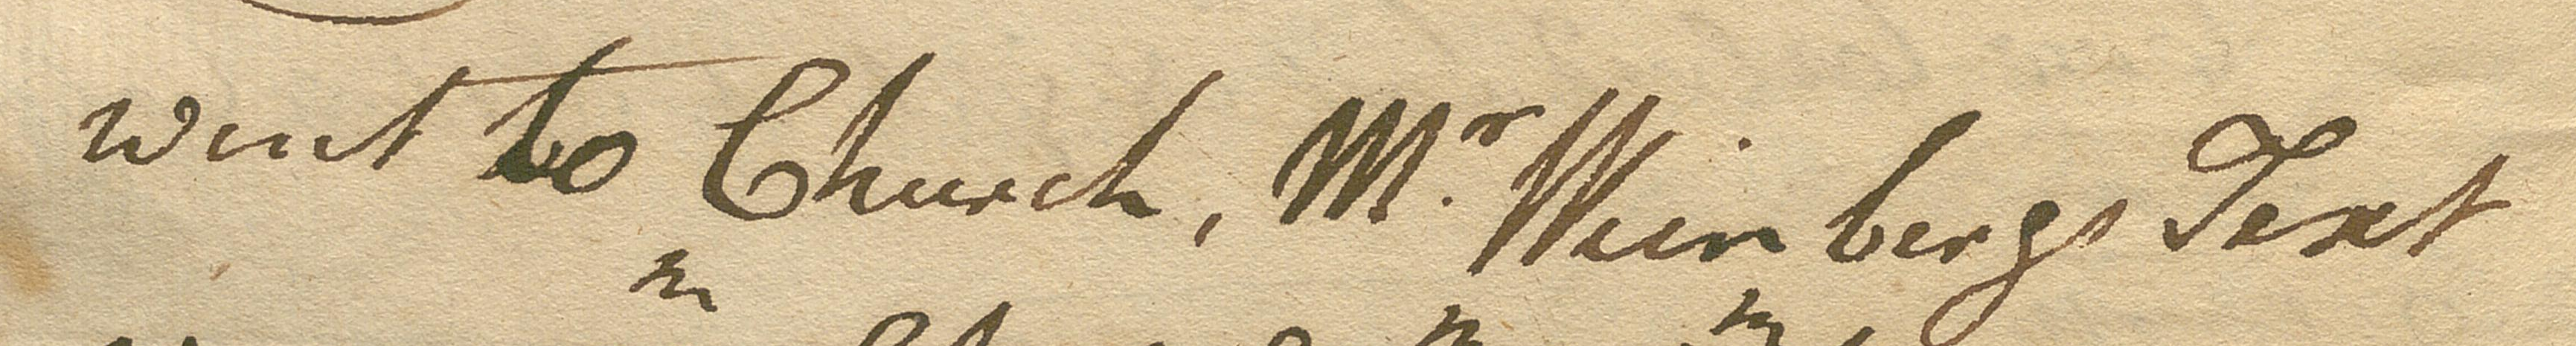went to Church, M^r. Weinbergs Text
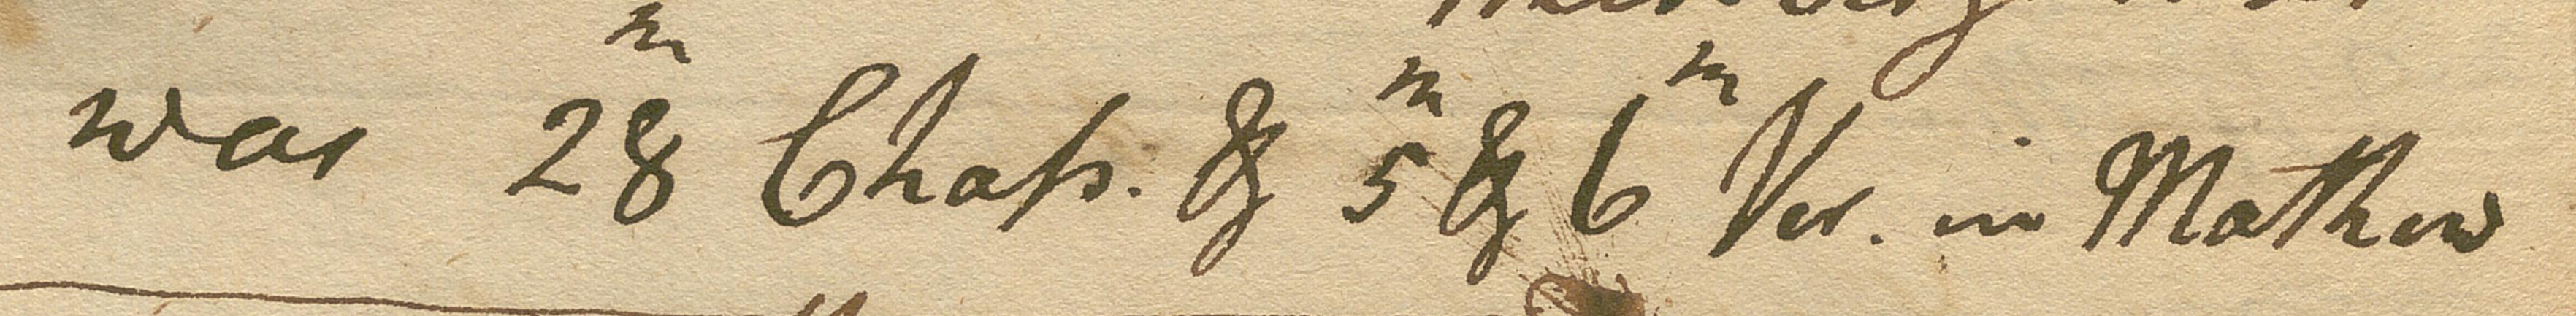was 28^th Chap. & 5^th & 6^th Ver. in Mathew
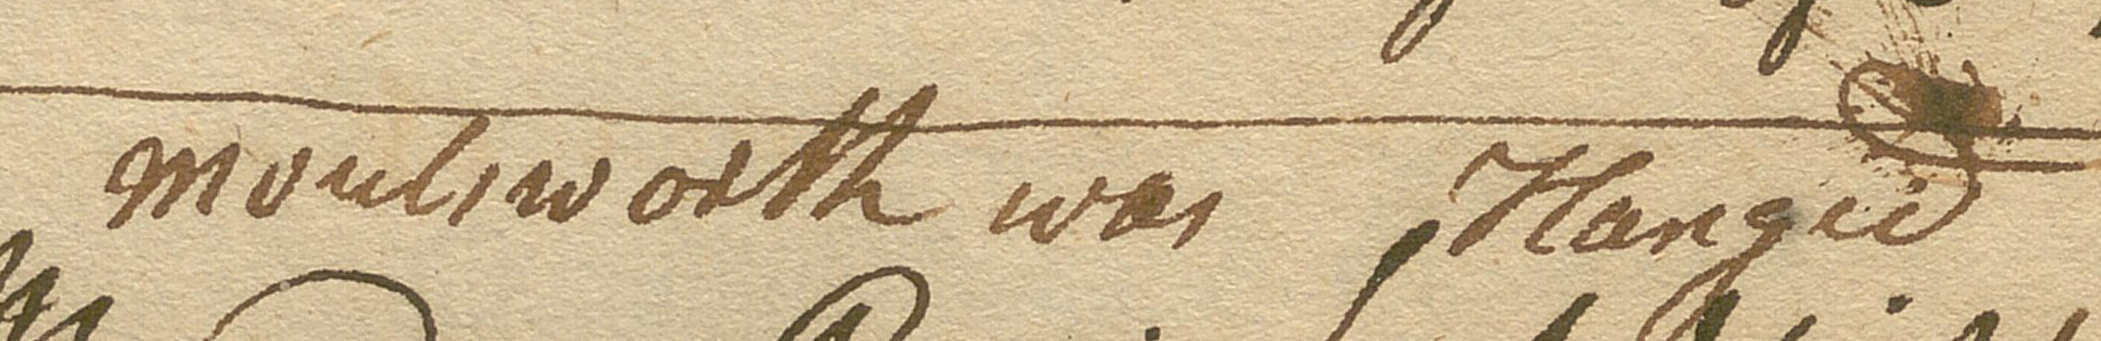moulsworth was Hanged
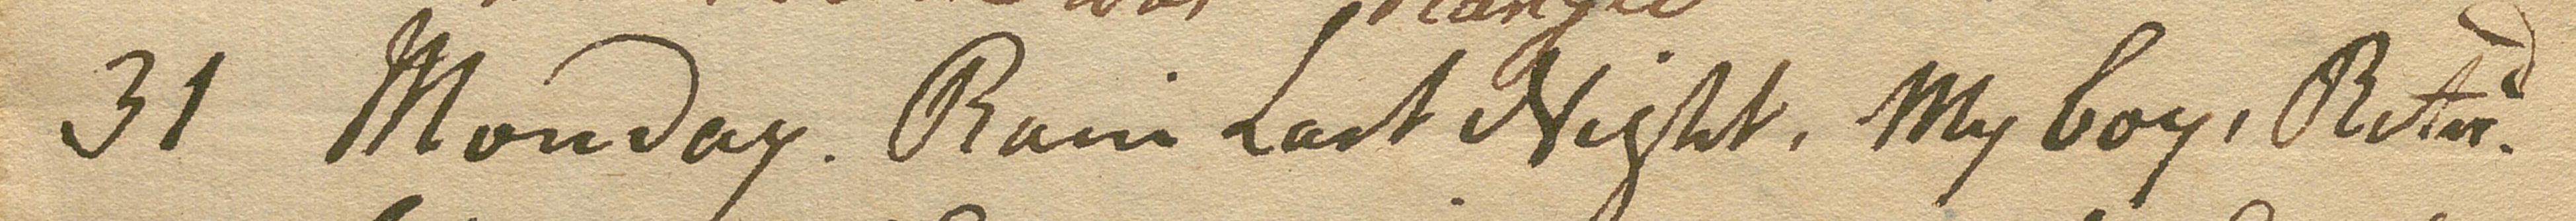31 Monday. Rain Last Night. My boys Retur^d.
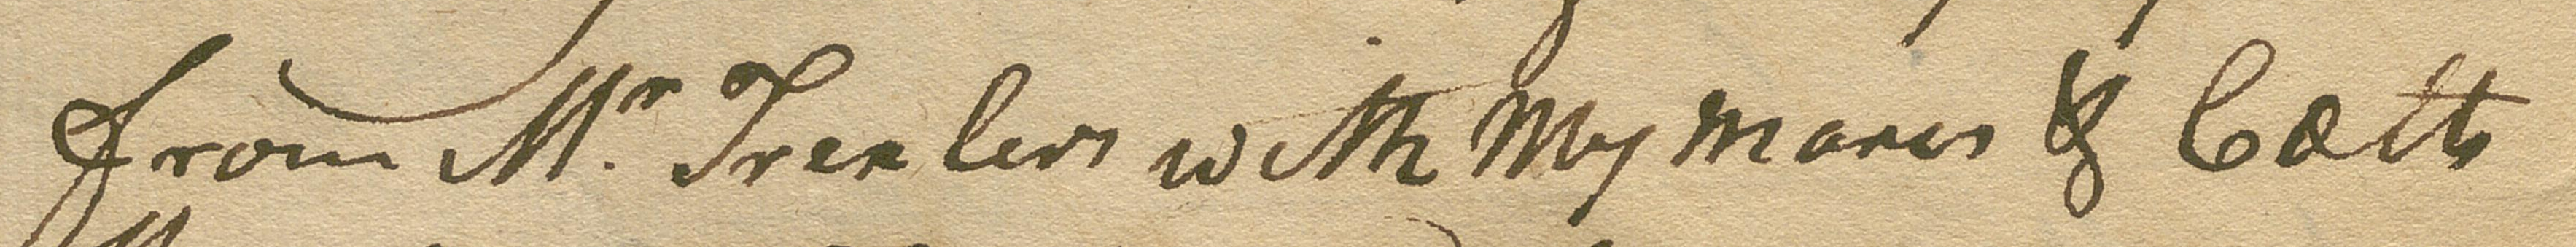from M^r. Trenlers with My mare & Colts
